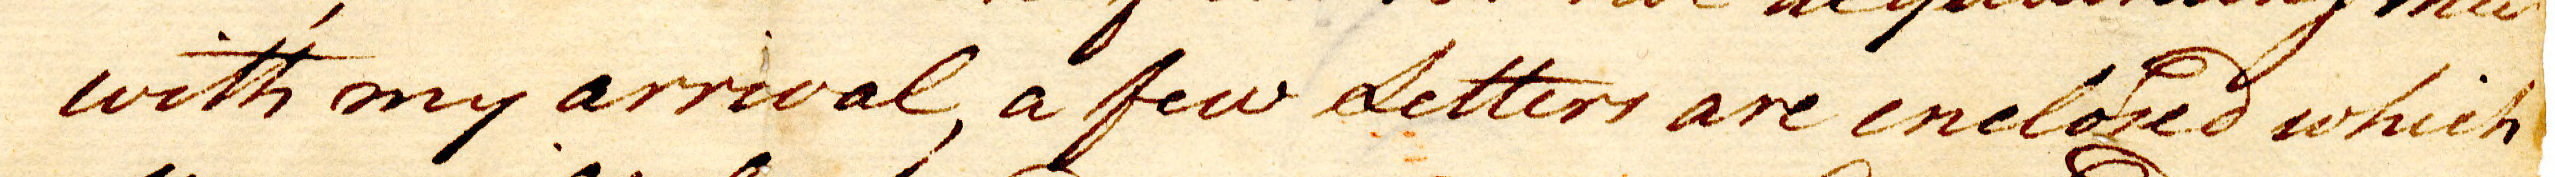with my arrival, a few Letters are enclosed which
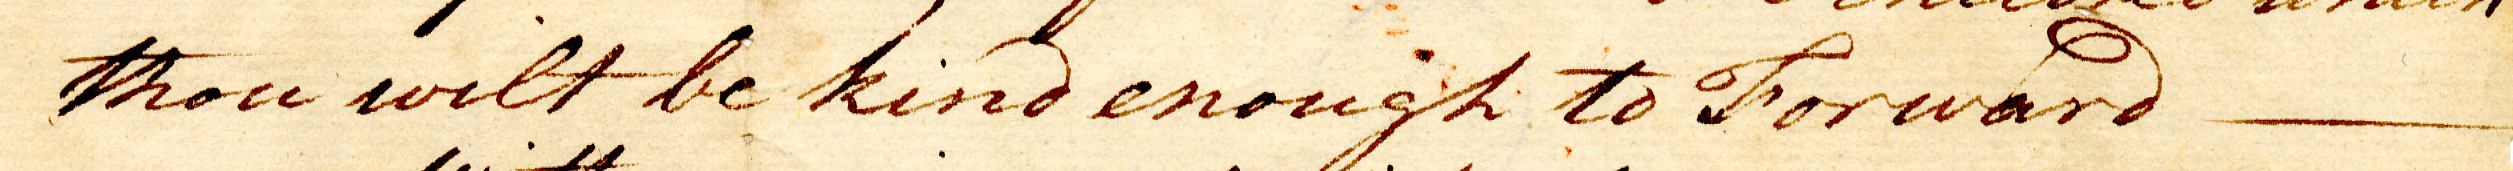thou will be kind enough to Forward-
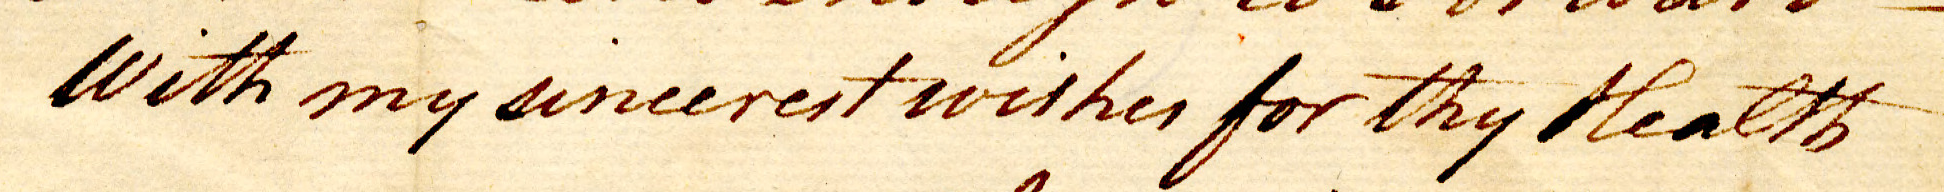With my sincerest wishes for thy Health
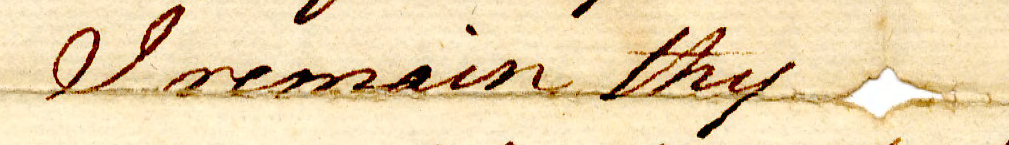I remain thy
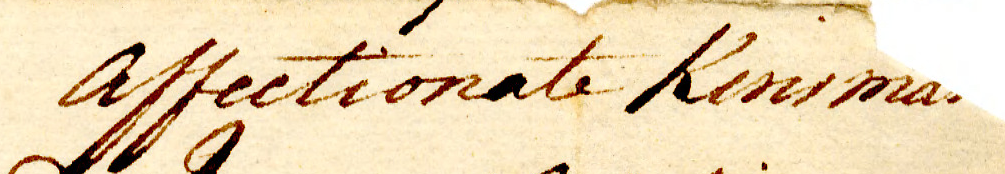affectionate Kinsman
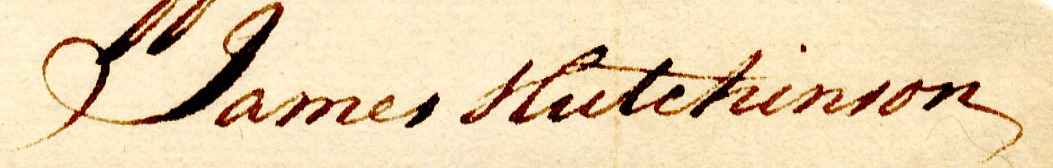James Hutchinson
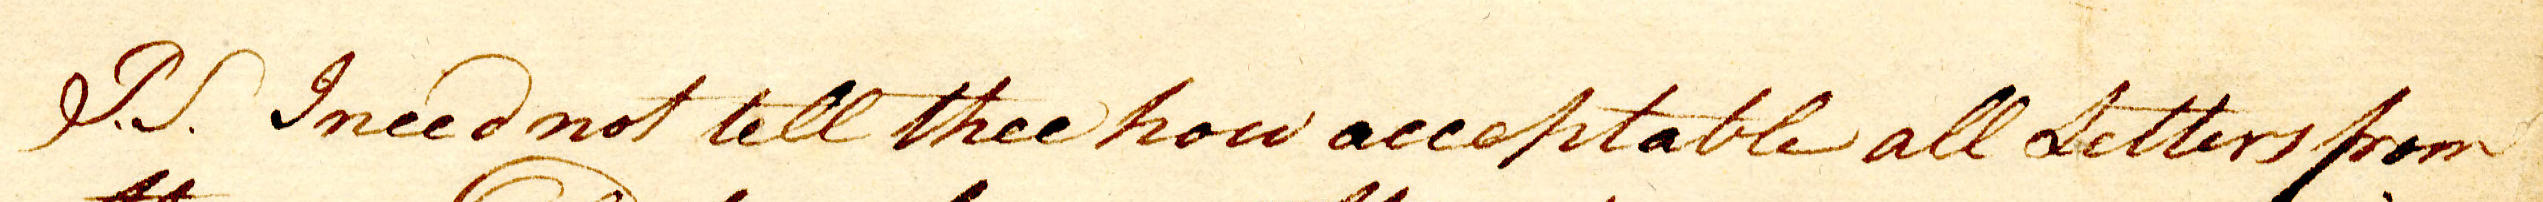P.S. I need not tell thee how acceptable all Letters from
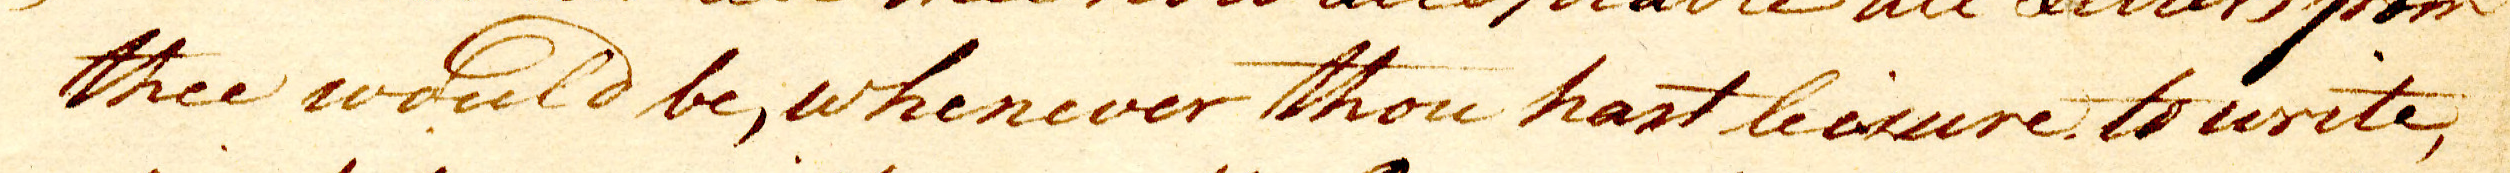thee would be, whenever thou hast leisure to write,
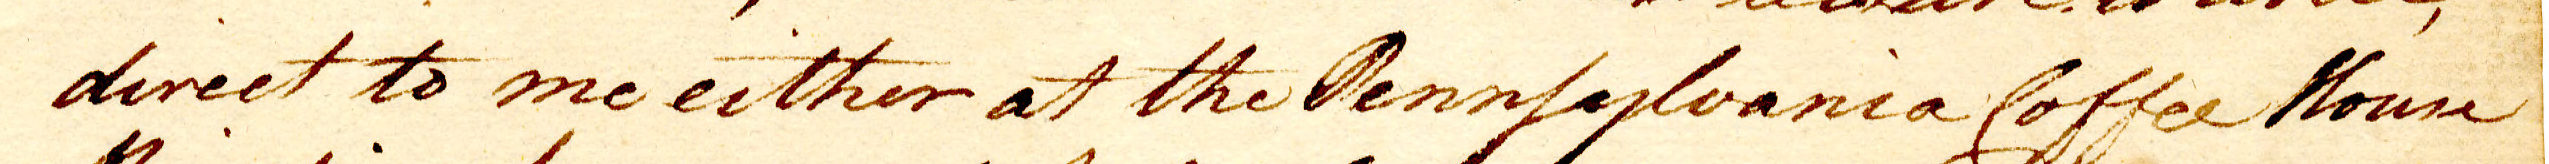direct to me either at the Pennsylvania Coffee House
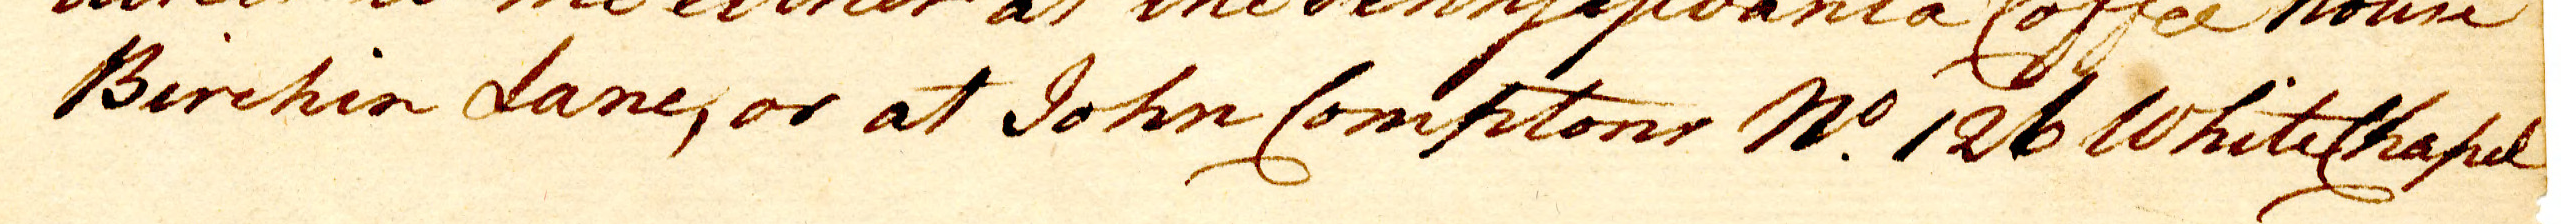Birchin Lane, or at John Comptons N^o. 126 White Chapel
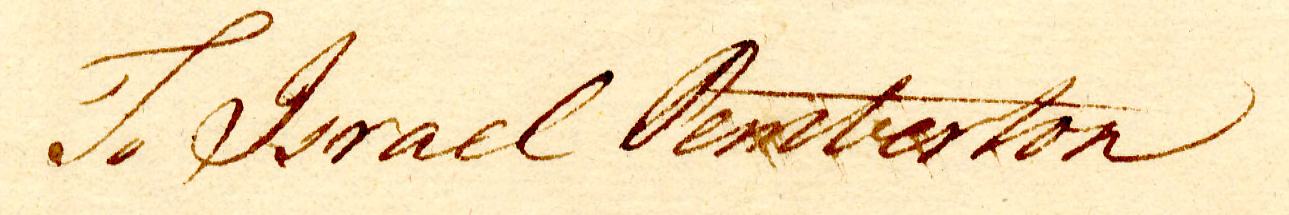To Israel Pemberton
